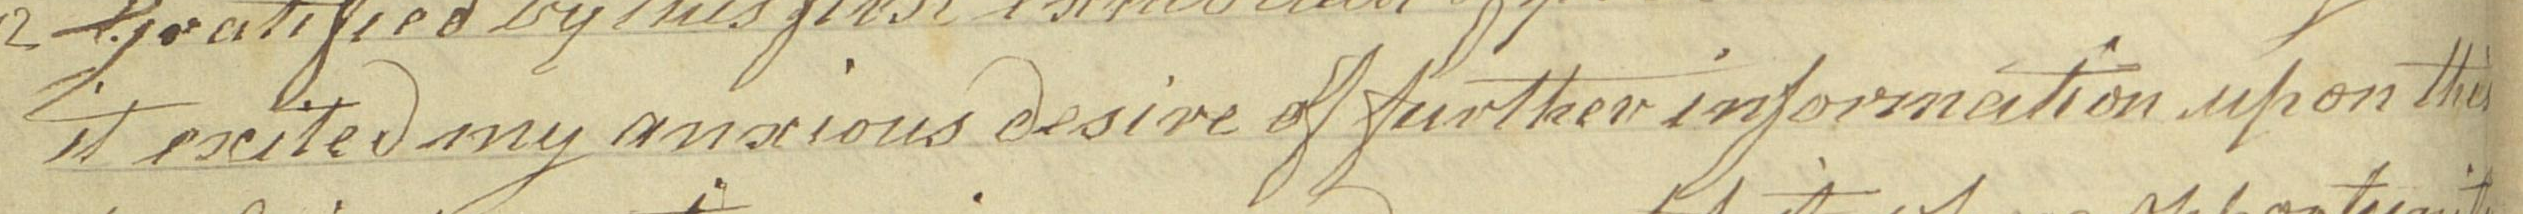it excited my anxious desire of further information upon the
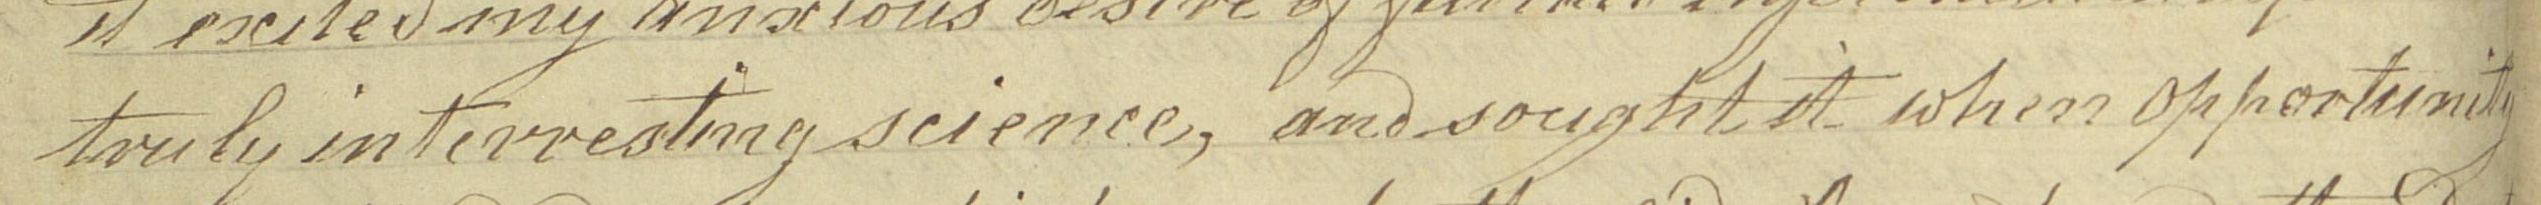truly interresting science, and sought it when opportunity
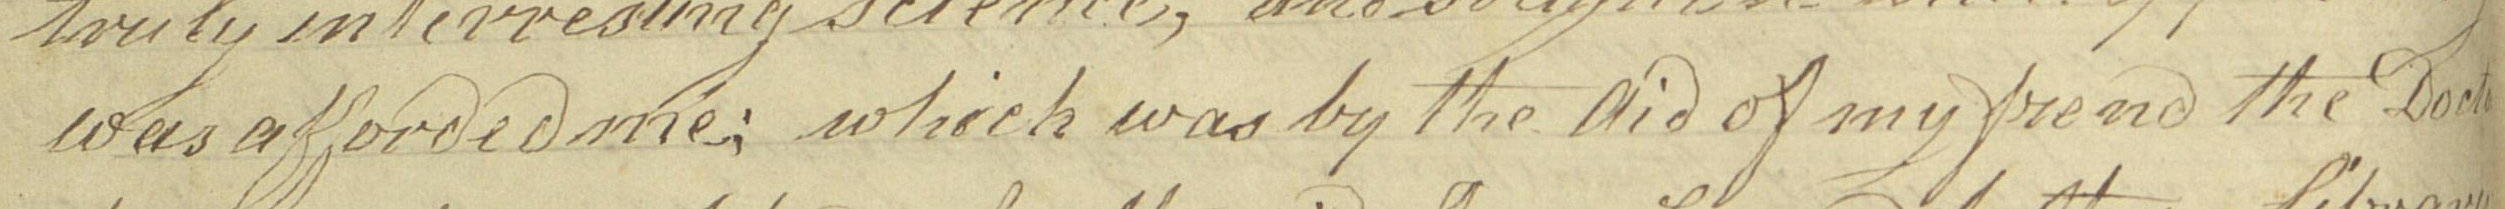was afforded me; which was by the Aid of my frend the Doc-
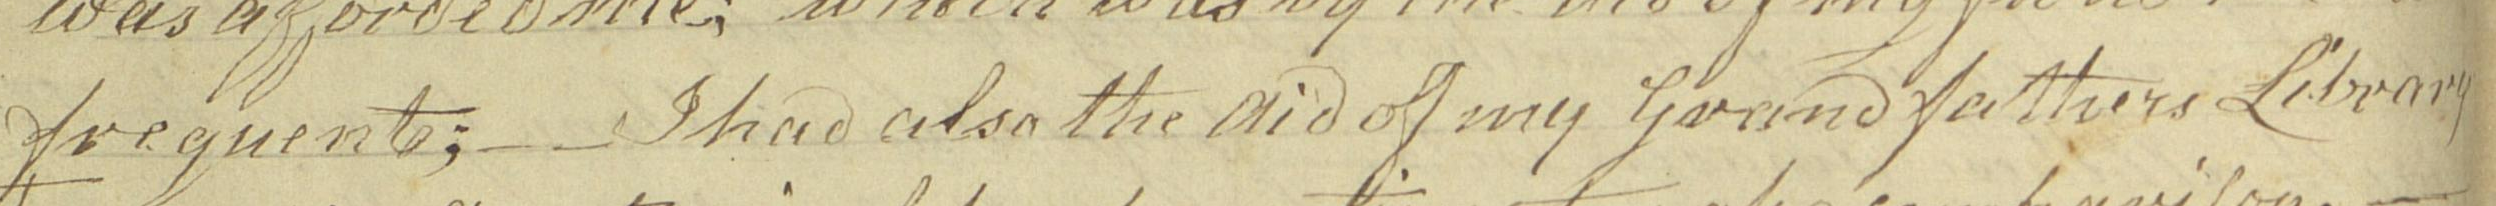frequent; I had also the Aid of my Grandfathers Library
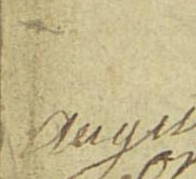August
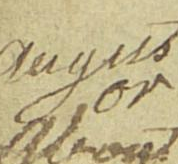or
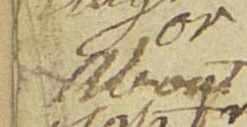About
